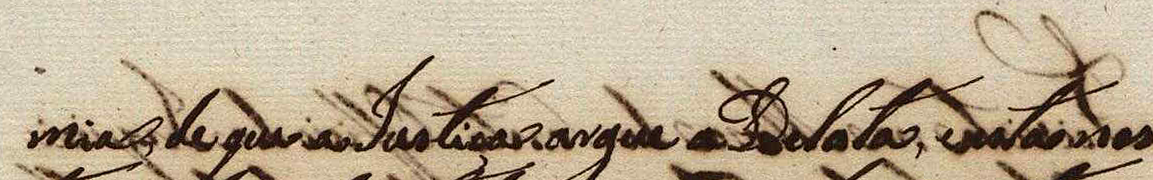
mia, de que a Iustiça argue a Delata, e esta nos
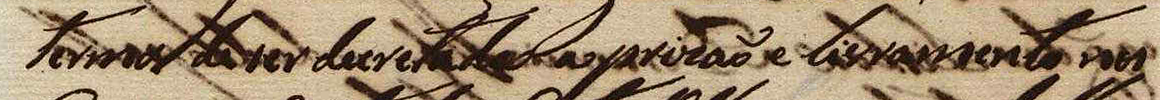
termos de ser decretada a prizaõ e livramento nos
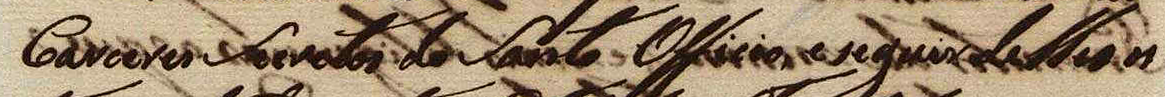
Carceres Secretos do Santo Officio, e seguir delles os
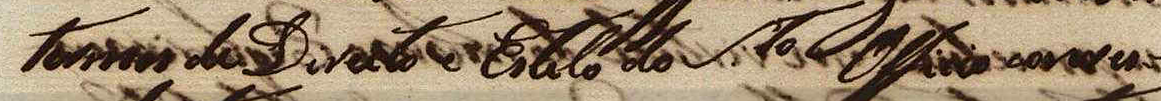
termos de Direito e Estilo do S.to Officio corres
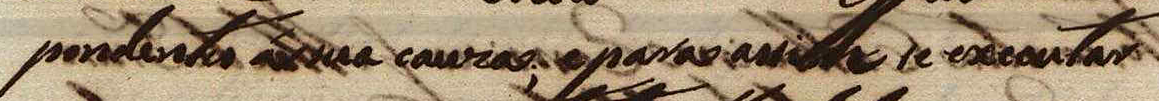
pondentes á sua cauza, e para assim se executar
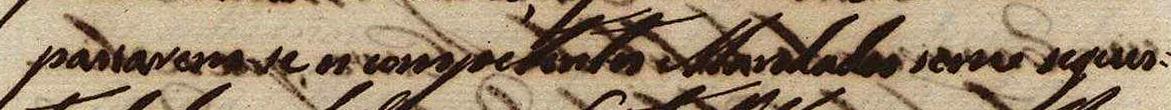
passarem-se os competentes Mandados sem seques
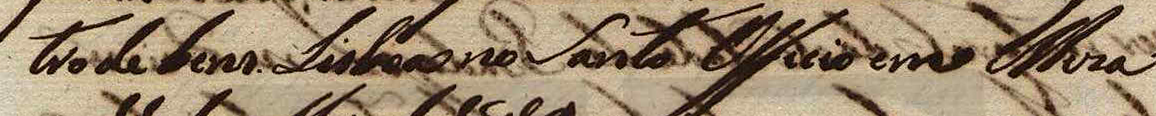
tro de bens: Lisboa no Santo Officio em Meza
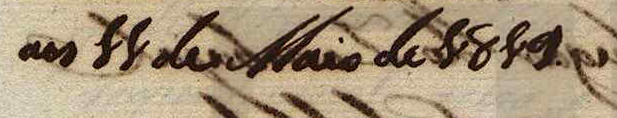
aos 11 de Maio de 1819.
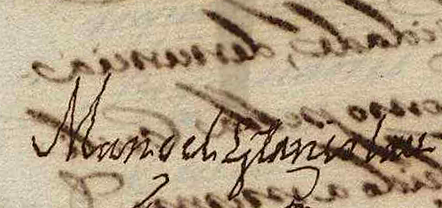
Manoel Estanislau
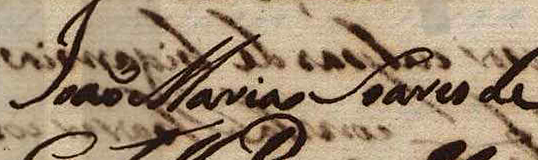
Ioaõ Maria Soares de
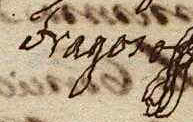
Fragoso
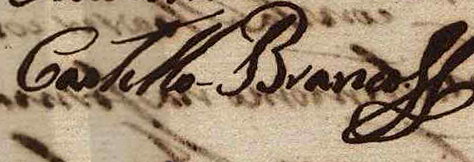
Castello-Branco
